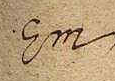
Em
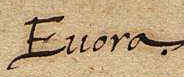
Euora.
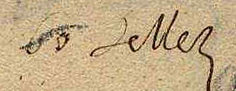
60 tellez
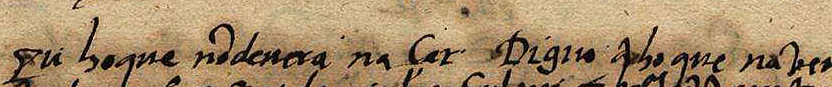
Eu ho que nō deuera na Cer Diguo q̄ ho que na ver
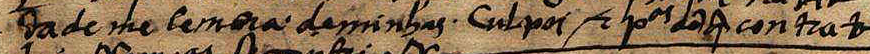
dade me lembra de minhas Culpas e pas cō q̄ contrata
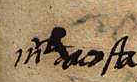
mel da costa
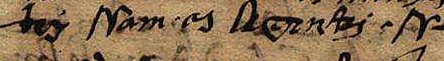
tey ssam as segintes .ss.
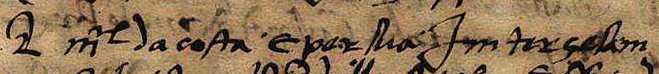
item mel da costa e por sua Jmtercesam
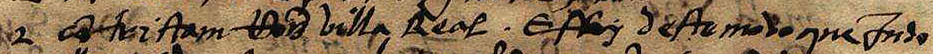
item cō tristam Roiz̄ villa Real. E ffoy deste modo que Indo
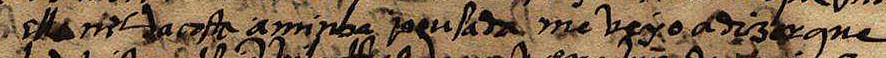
Elle mel da costa a minha pousada me veyo a dizer que
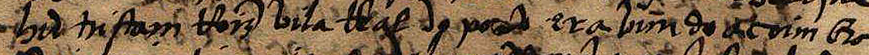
hū tristam Roīz vila Real do porto era vimdo a coimbra
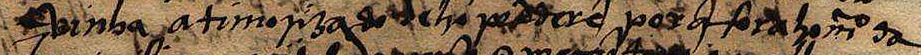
e vinha atimorizado de ho prēderē porq̄ fora ho mro da
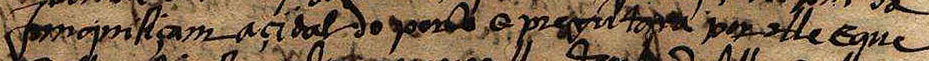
Jmquisiçam a cidal do porto e pregūtara por elle E que
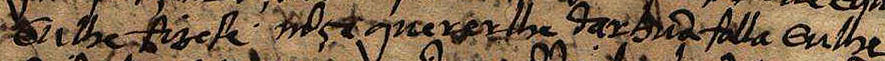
Eu lhe fizese m̄ce quererlhe dar huā falla Eu lhe
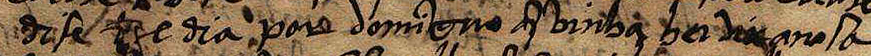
dise _e dia por domīguo q̄ vinha hei dir a nosa
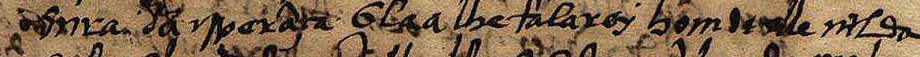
snra da esperāça E laa lhe falarey homde elle mel da
